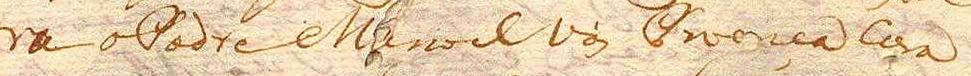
ra o Padre Manoel váz Proença Cura
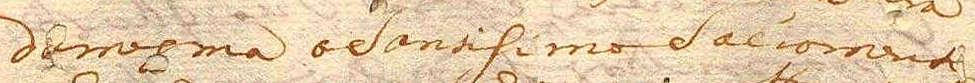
da mesma o Santisimo Sacramento
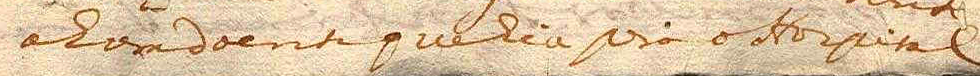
a hum doente que hia pera o Hospital
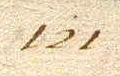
121
